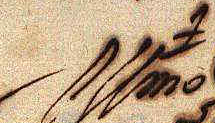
Jllm̄o
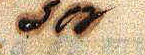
sōr
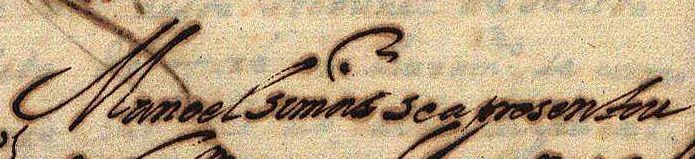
Manoel simoĩs se apresentou
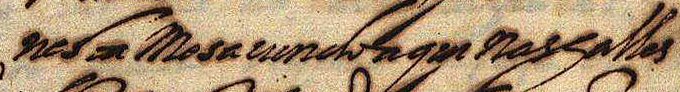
nesta Mesa uindo aqui nas galles
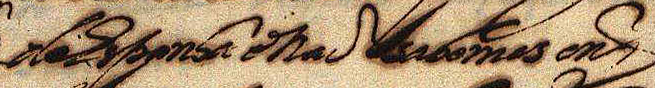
de Espanha e naõ sabemos en q̄
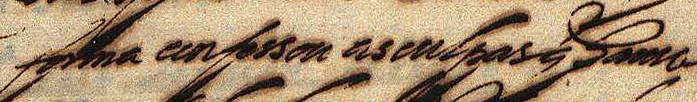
forma confessou as culpas q̄ hauia
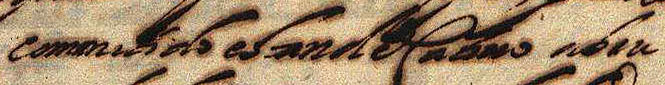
commetido estando Catiuo abiu
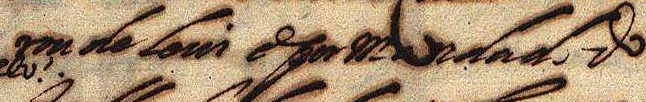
rou de leui e por mandado do
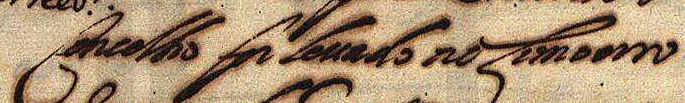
Concelho foi leuado no Limoeiro
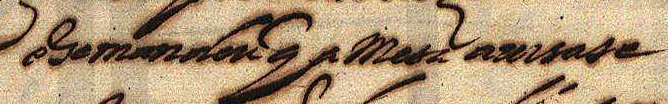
e ho mandou q̄ a mesa auisase
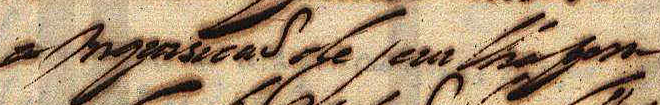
a Jnquisiçaõ de seuilha pera
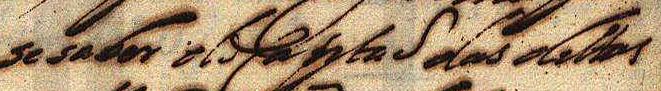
se saber do Capitaõ das dittas
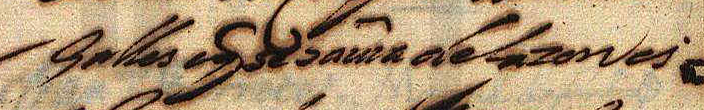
Galles e q̄ se o auia de fazer a es
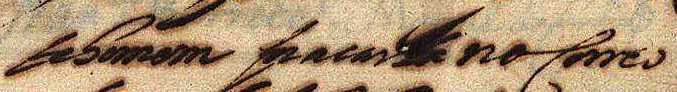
te homem pra carta no Correo
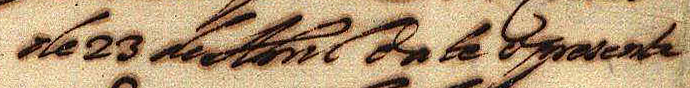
de 23 de Abril e ate o presente
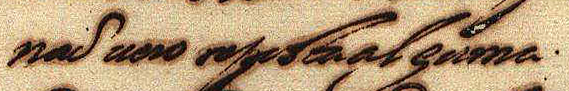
naõ ueio reposta alguma.
